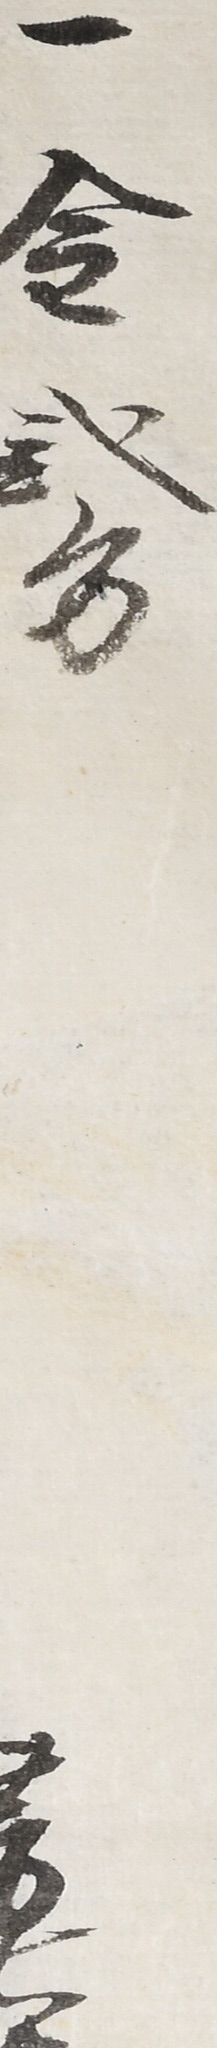一金弐分芳右衛門
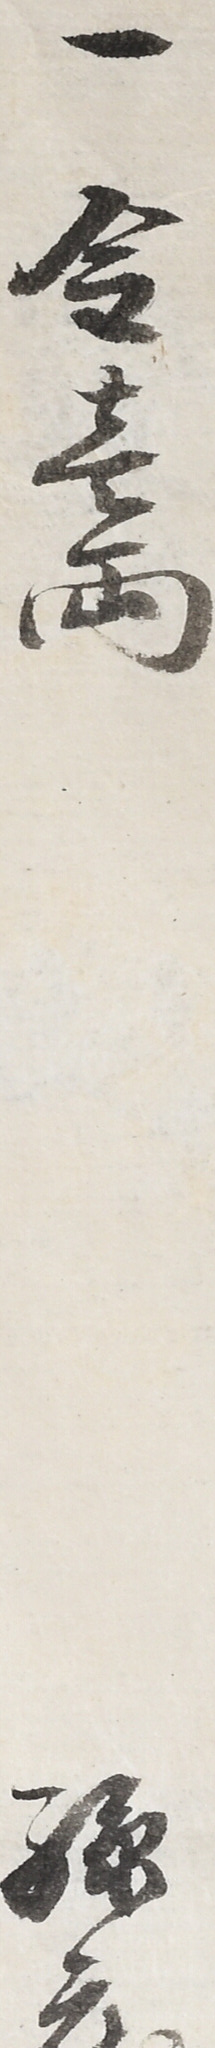一金壱両孫蔵
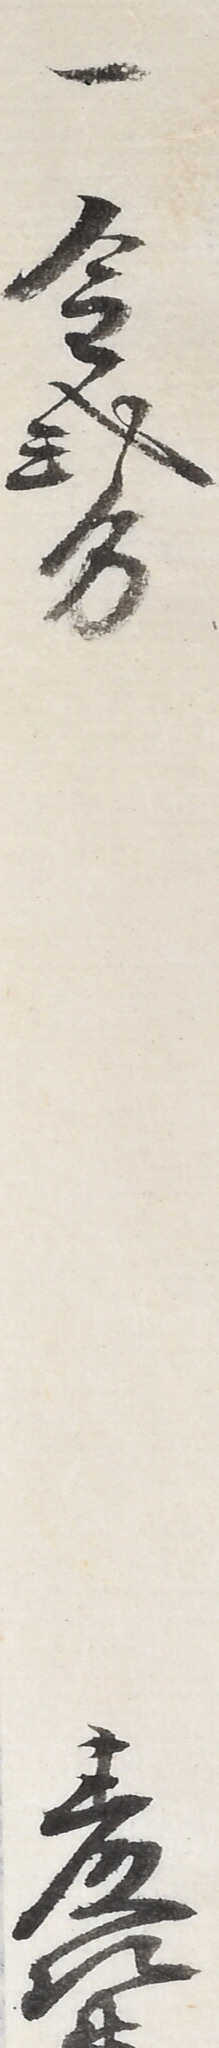一金弐分彦左衛門
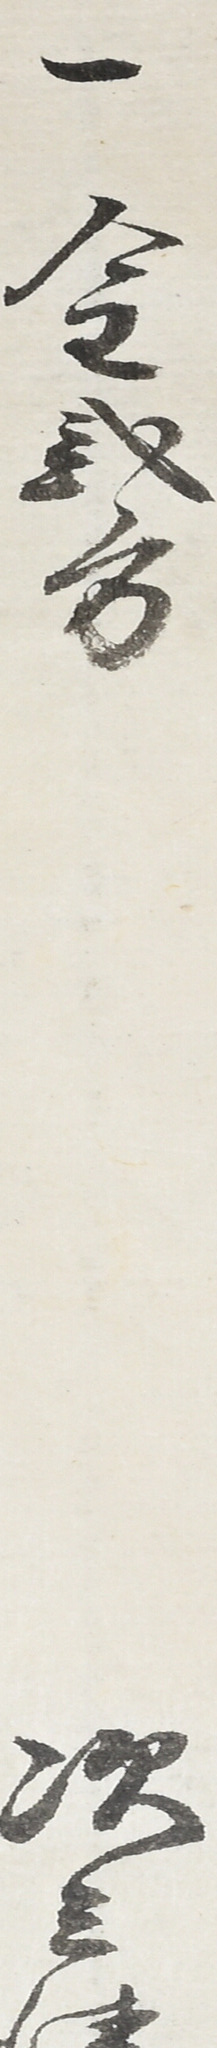一金弐分芳右衛門

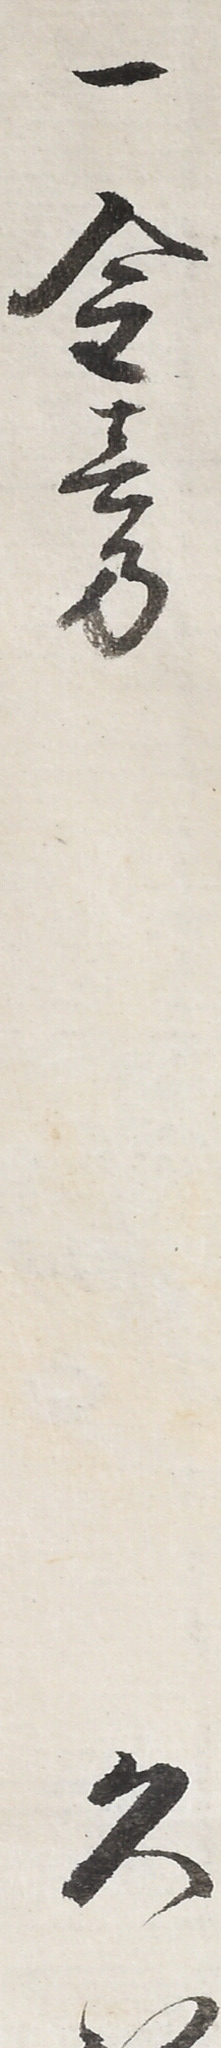一金壱分久弥
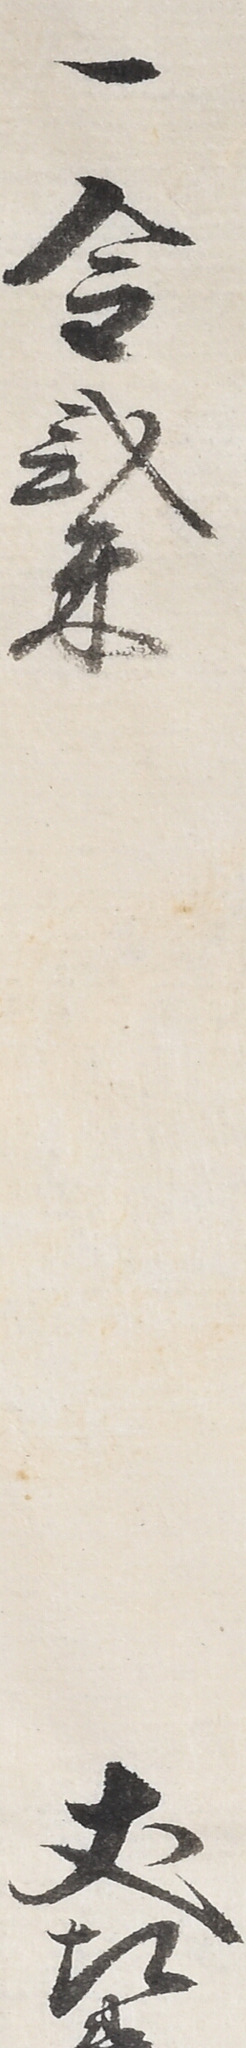一金弐朱丈左衛門
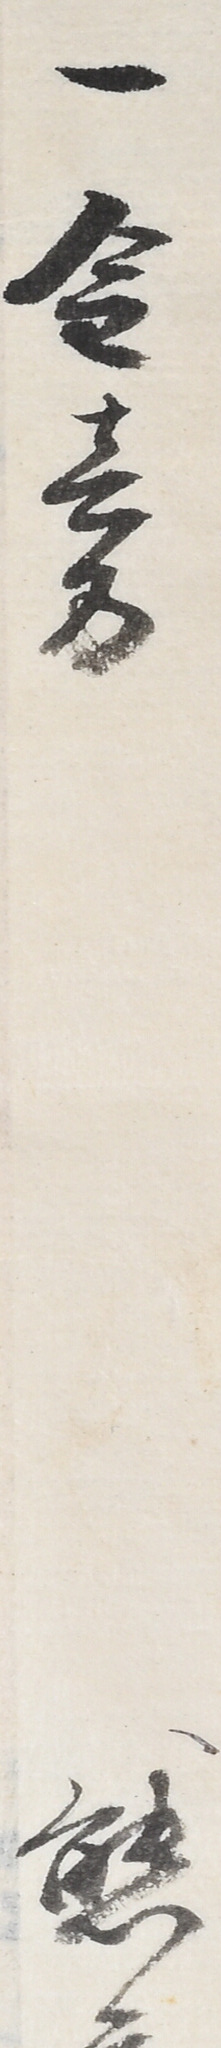一金壱分熊蔵
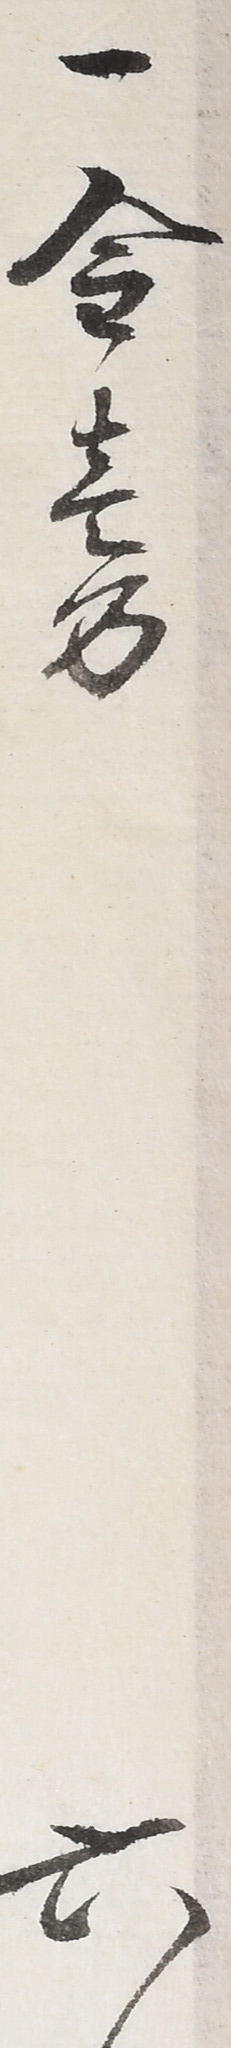一金壱分六兵衛
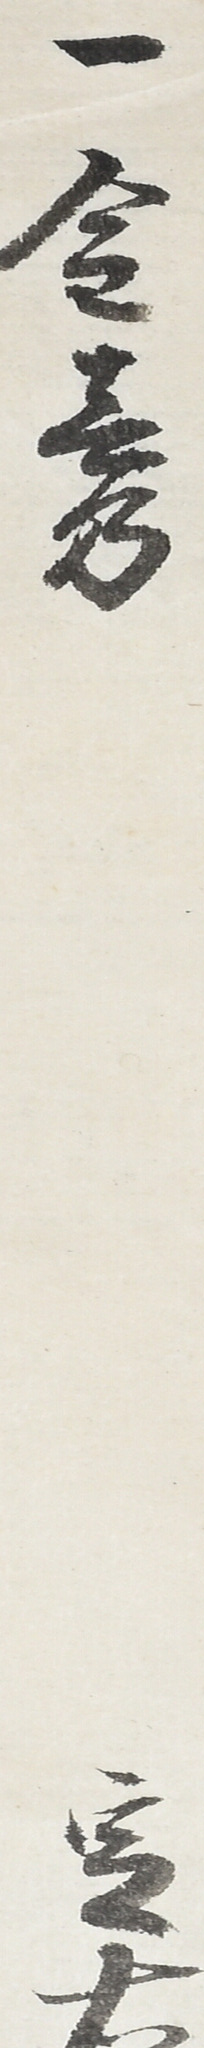一金壱分久弥
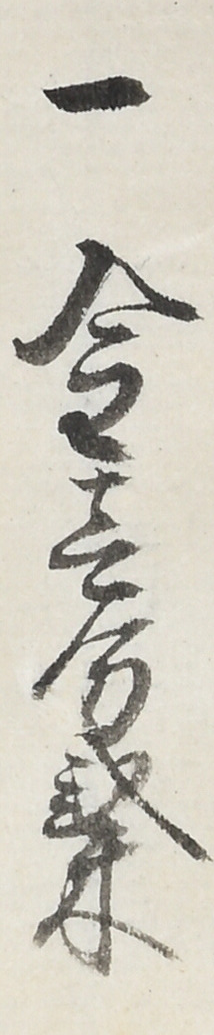一金壱分久弥

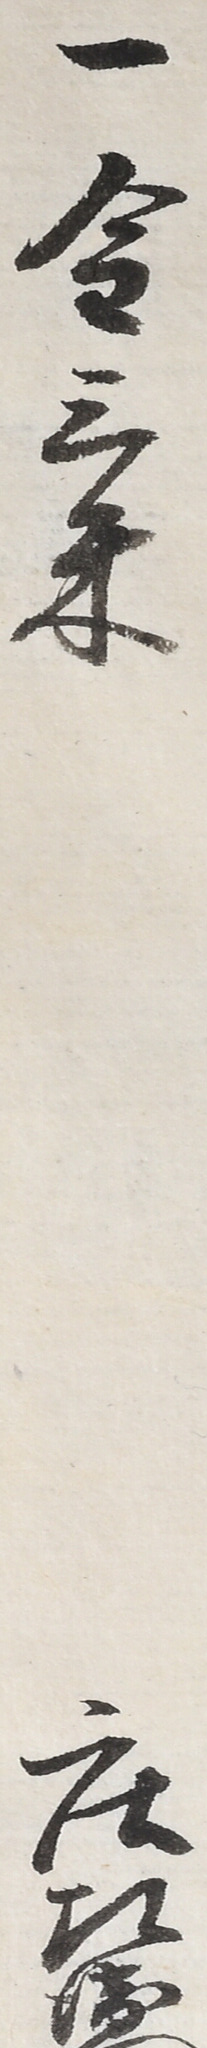一金三朱庄左衛門
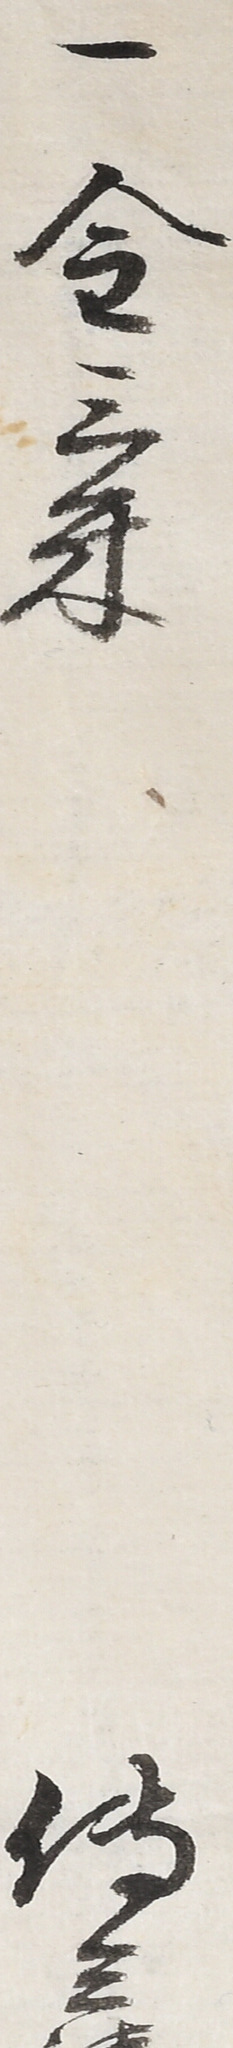一金三朱伝兵衛
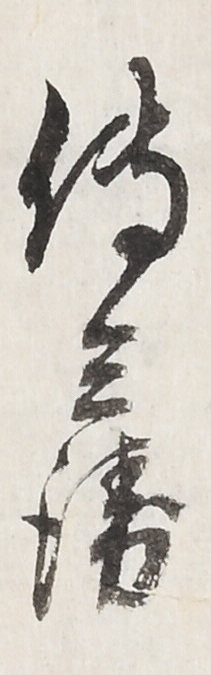市兵衛
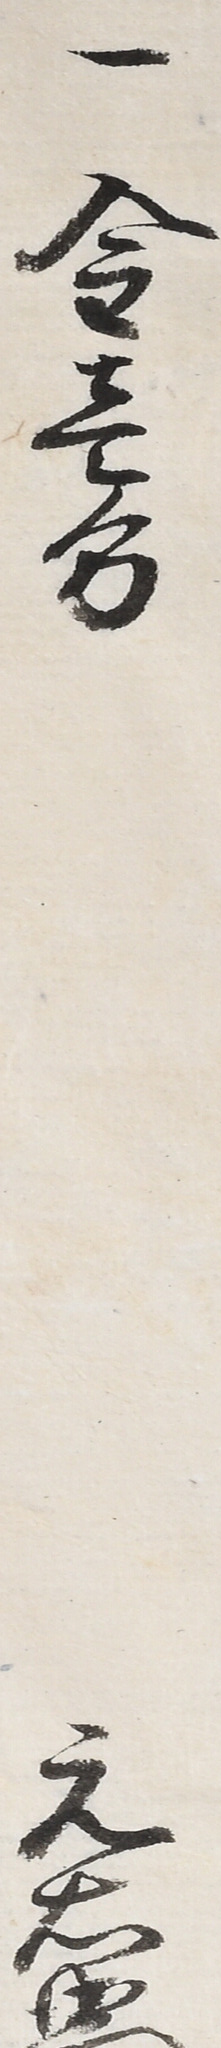一金壱分元右衛門
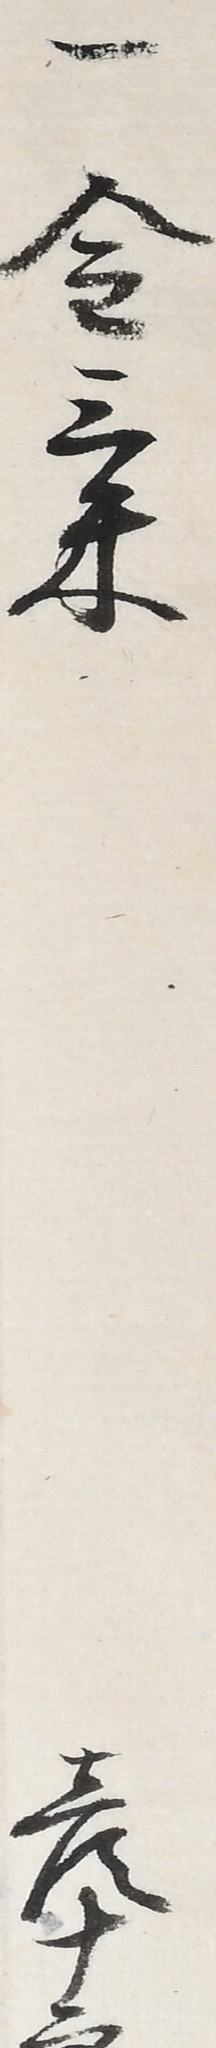一金三朱彦十郎
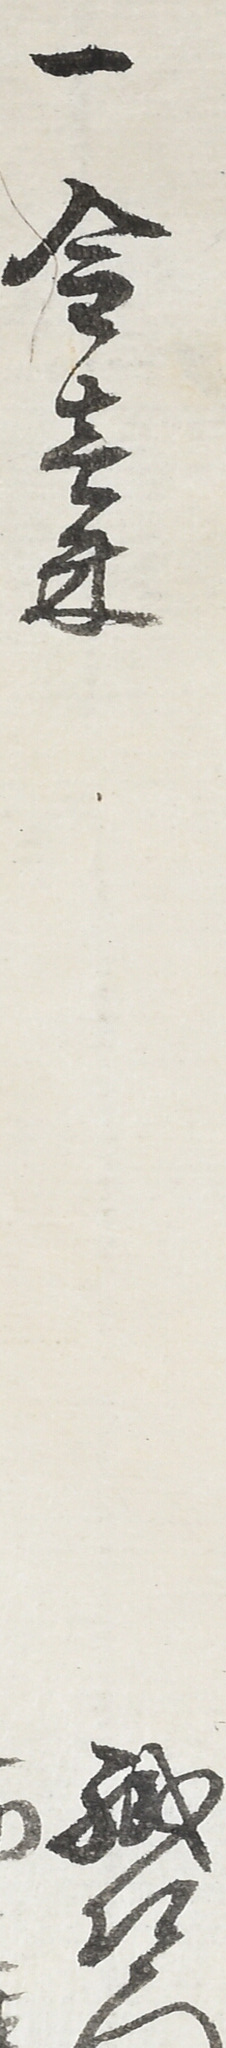一金壱朱織左衛門
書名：御拝地百五拾年御祝儀献上御目録名前
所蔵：伊那市立高遠町図書館・合同会社AMANE
